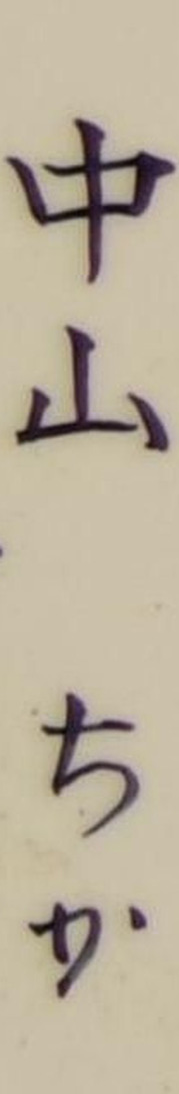中山ちか
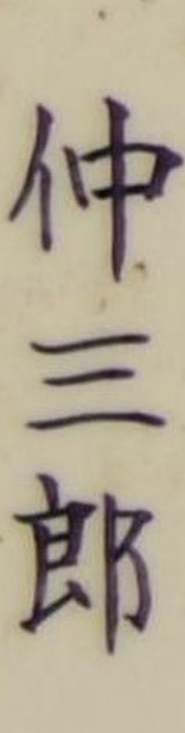仲三郎

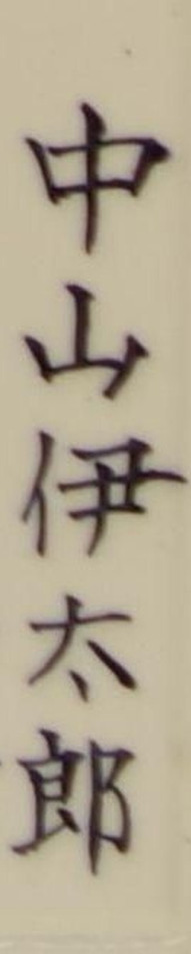中山伊太郎
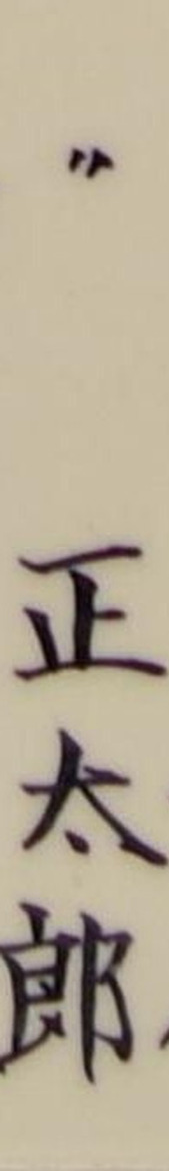正太郎
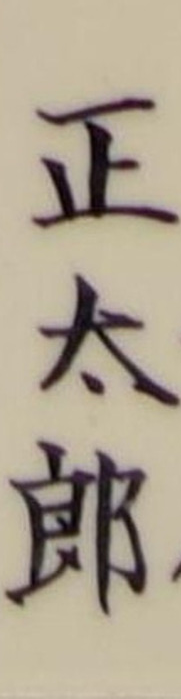正太郎
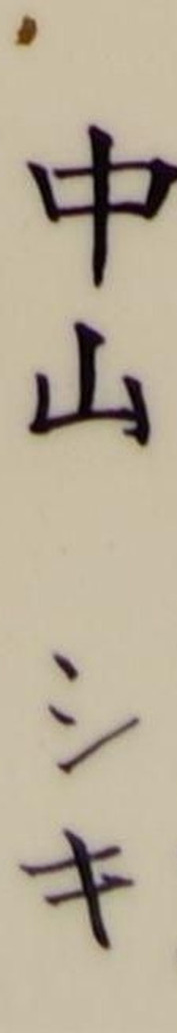中山シキ
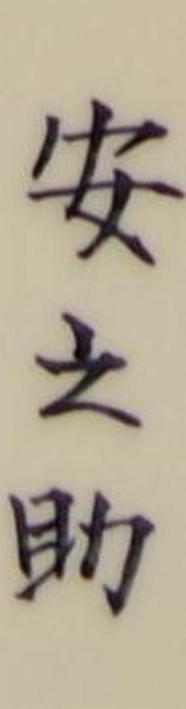安之助
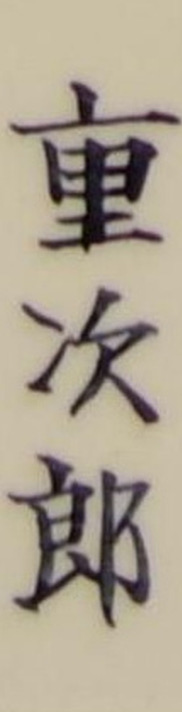重次郎
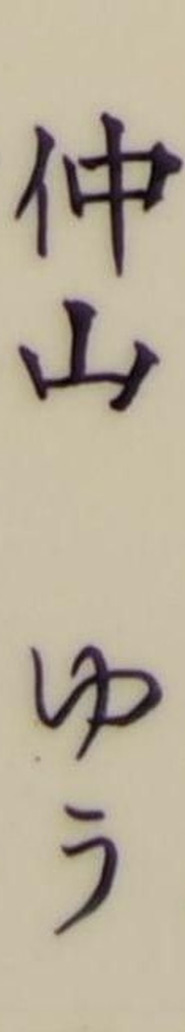仲山ゆう
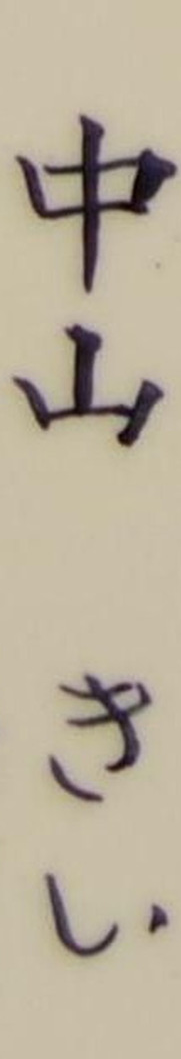中山きい
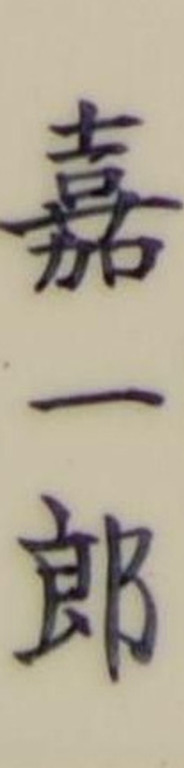嘉一郎
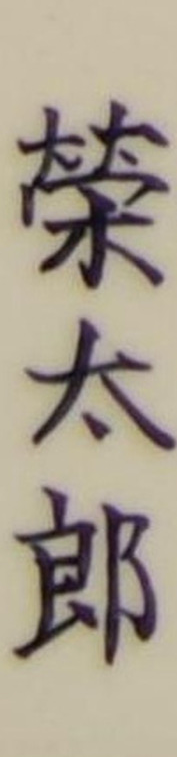榮太郎

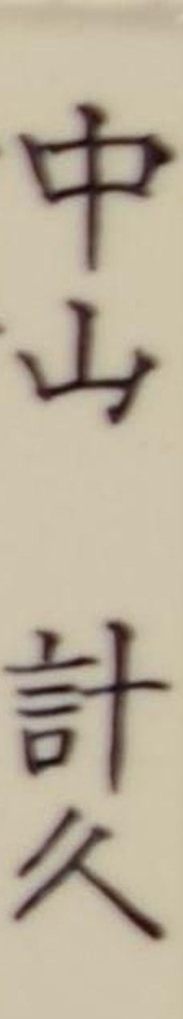中山計久
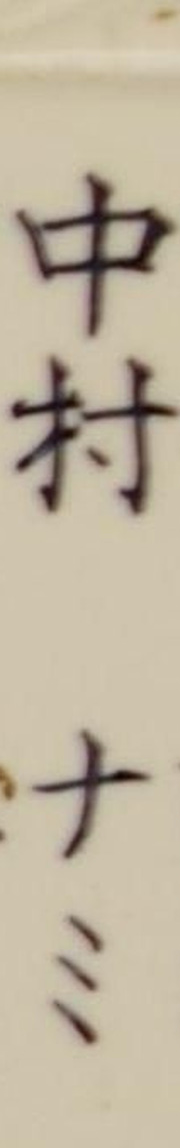中村ナミ
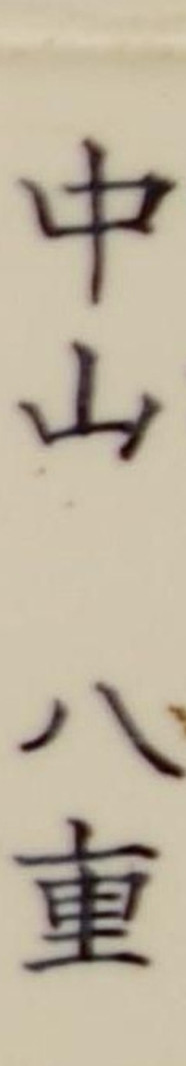中山八重
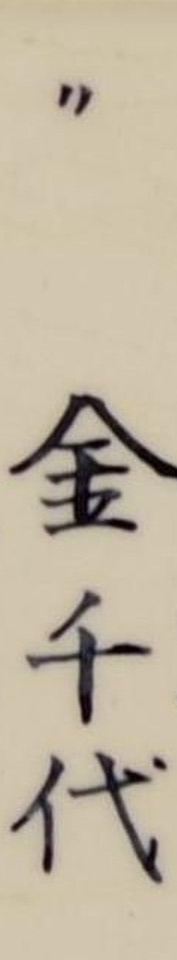金千代
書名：A~D
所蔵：koyasan kongobuji
